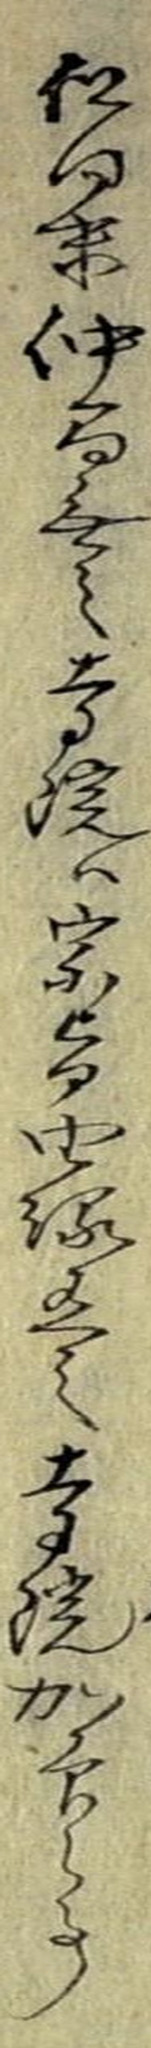但同末仲間無之寺院ハ宗旨由縁有之寺院加印之事
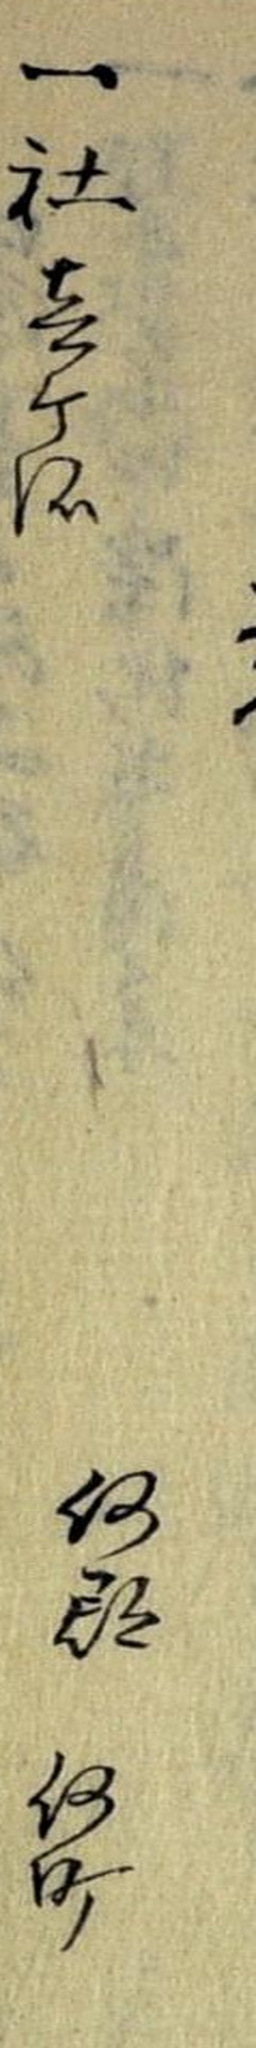一社壱ケ所何郡何町
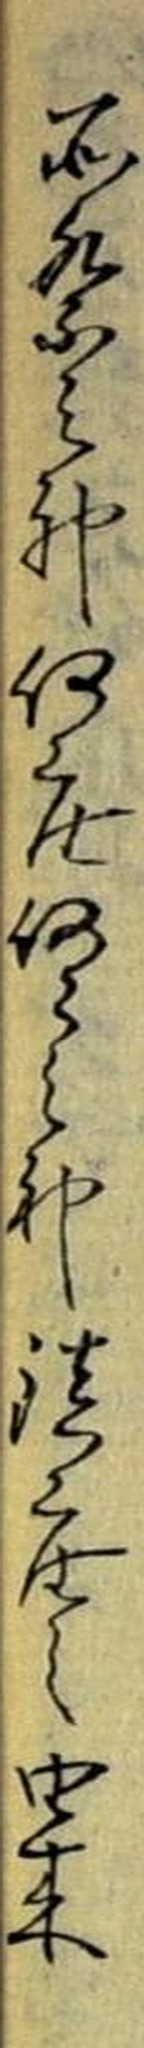所祭之神何庄何々之神鎮座之由来
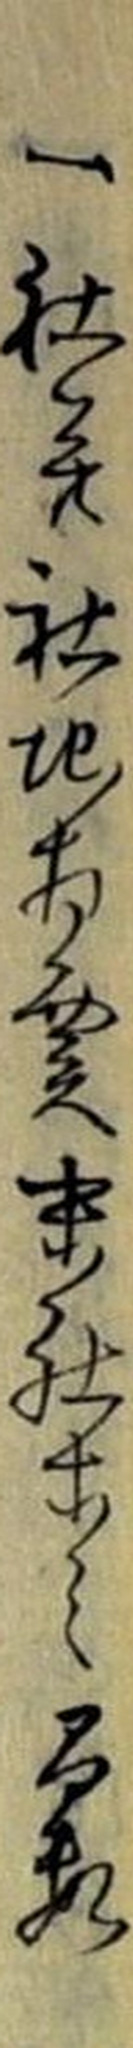一社并社地拝殿末社等之間数
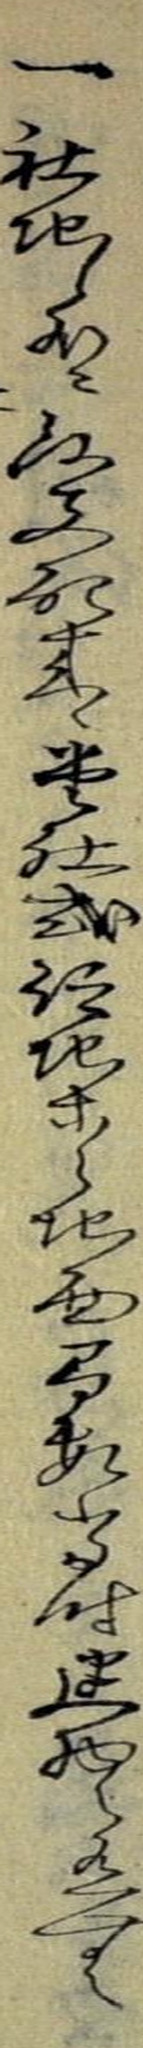一社地之外ニ致支配来候堂社式跡地等之地面間数当時建物之有無
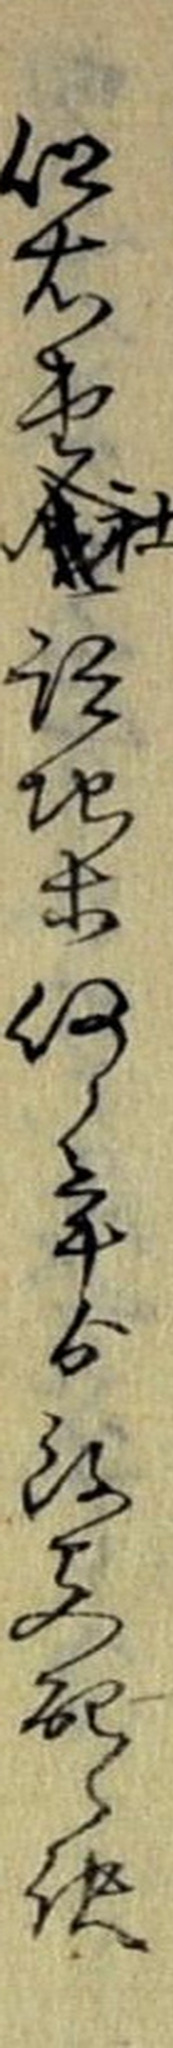但右堂社跡地等何ノ年ゟ致支配之訳
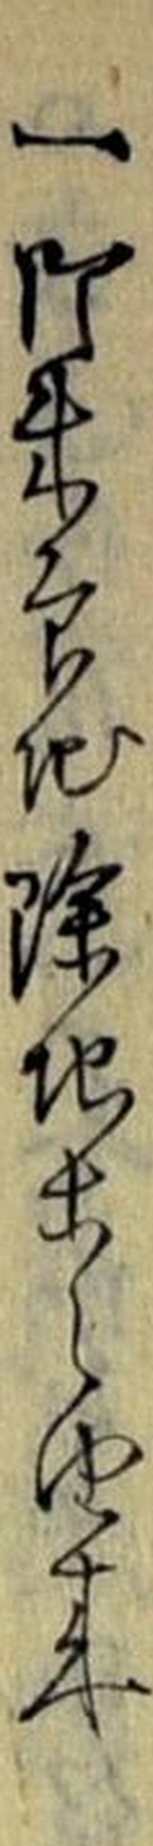一御朱印地除地等之由来
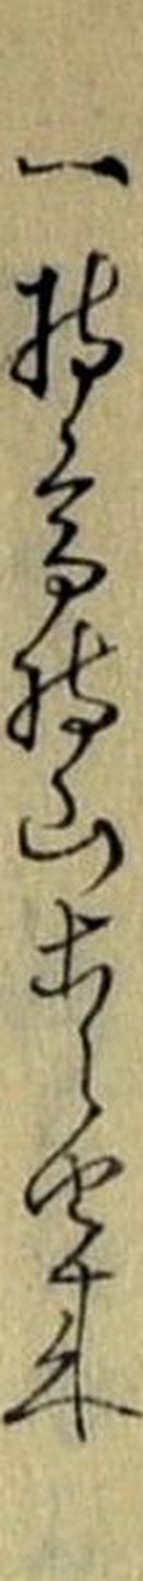一持高持山等之由来
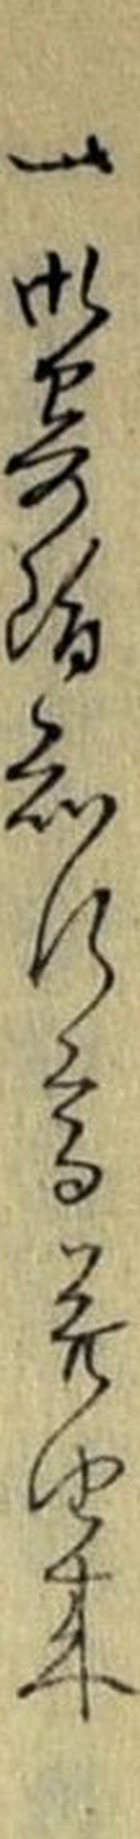一御寄附知行高并由来
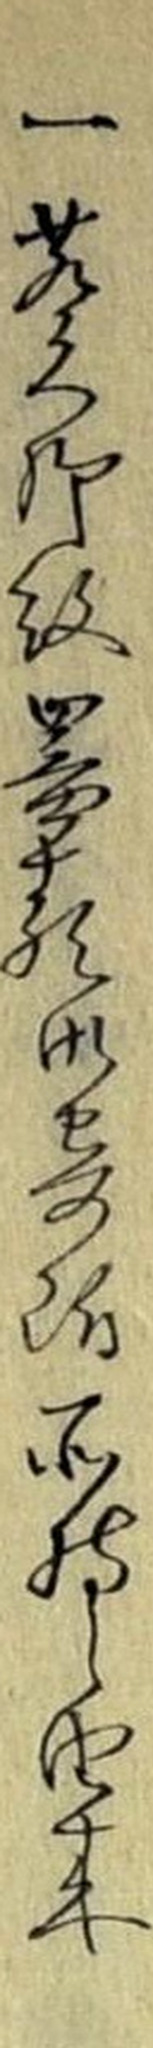一葵御紋冪類御寄附所持之由来
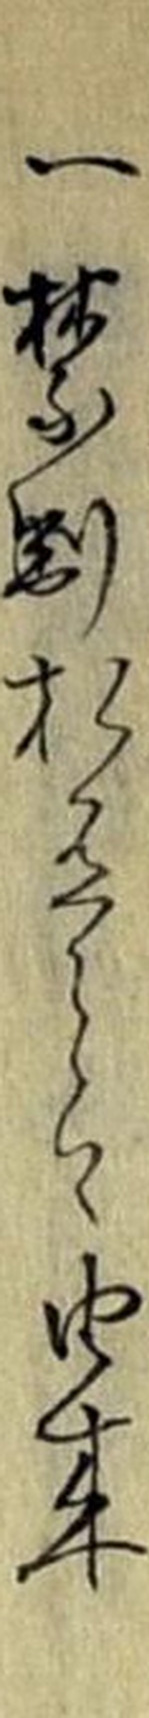一禁制札有之候ハヽ由来
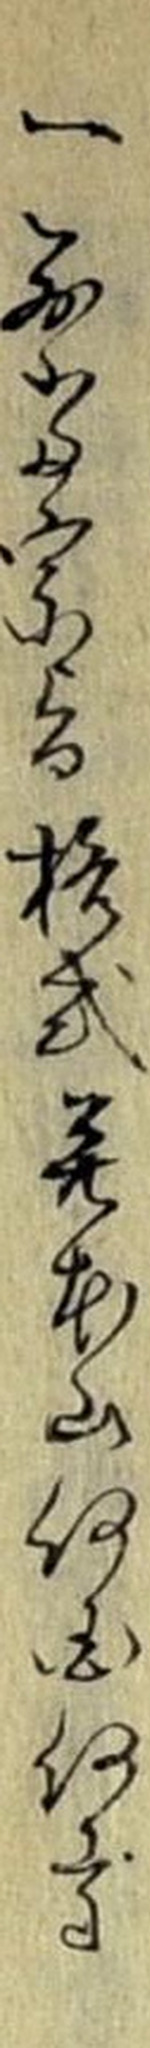一別当宗旨格式并本山何国何寺
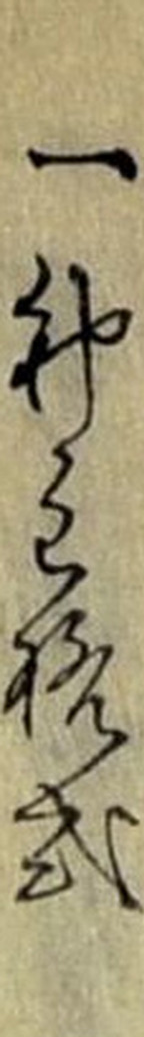一神主格式
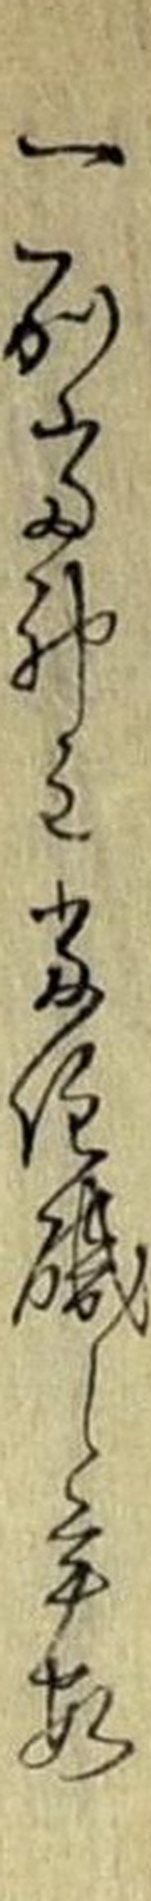一別当神主当住職之年数
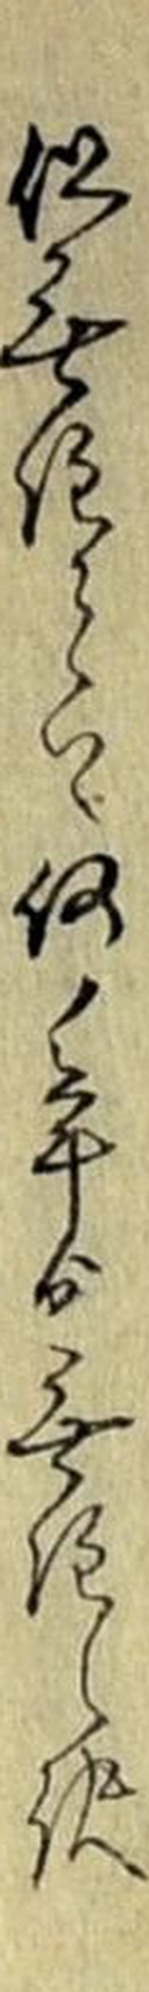但無住ニ候ハヽ何ノ年ゟ無住之訳
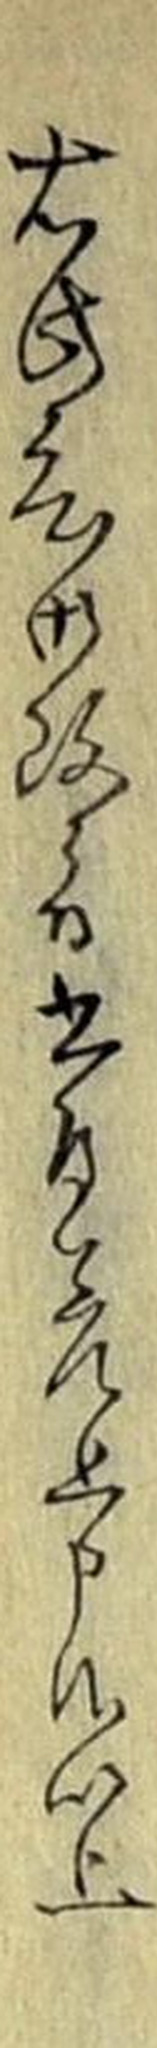右此度御改ニ付書付差上申候以上
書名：命令之部 五
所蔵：福井県文書館 Fukui Prefectural Archives
